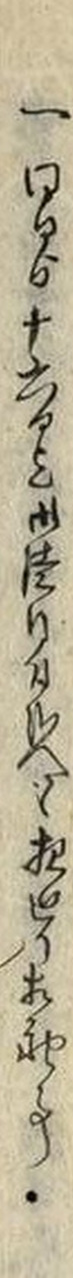一同日ゟ十六日迄御徒目付弐人ツヽ夜廻り相勤候事
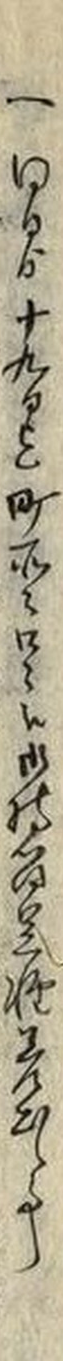一同日ゟ十九日迄町所々口々え御持筒足軽差出候事
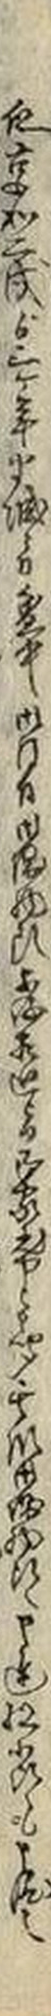但享和二戌ゟ三ケ年半減に付盆中御目付御側物頭不残相廻旨御家老中被申聞其段御側物頭へ申達組小頭へも申渡之
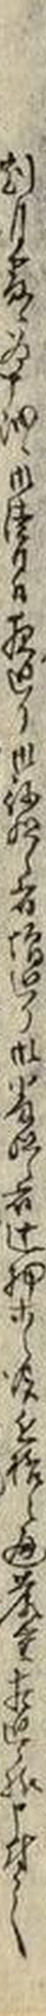割月番え為申越候御徒目付夜廻り御役組之者増廻り御番組之者辻押等之儀は近格之通厳重相廻候様申付之
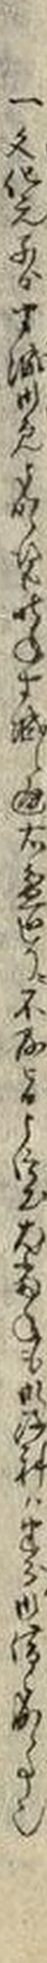一文化元子ゟ半減御免被成候得共昨年半減之通右盆廻りに不及旨被仰出尤当年も御役料は半分御借被成候事也
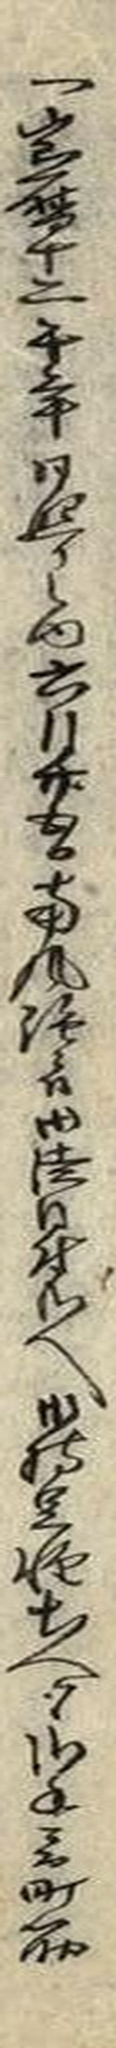一宝暦十二午年日照り之内六月廿五日南風強に付御徒目付弐人御持足軽十人ツヽ弐手にて町筋
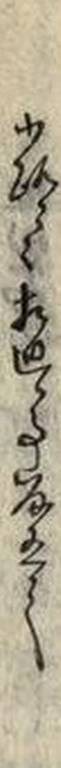小路々々相廻候事留有之
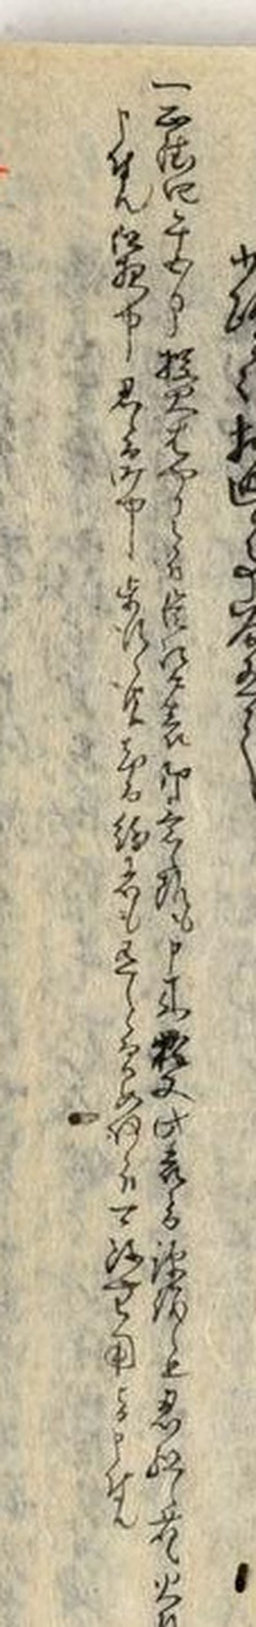申付ル但夜中忍にて町中歩行候儀は却て紛者も有之候ては如何に付可致無用旨申付ル

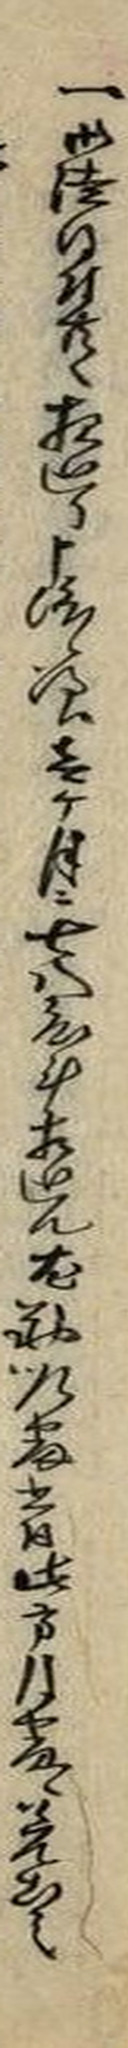一御徒目付共へ夜廻り申渡候得は壱ケ月に七八度斗相廻ル尤勤順番書付此方月番へ差出之
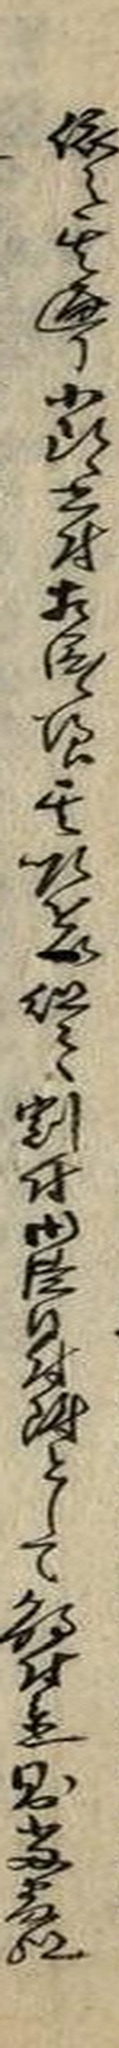依之其通り小頭へ書付相渡候得は其順を以組々へ割付御徒目付附として触付置則当番組
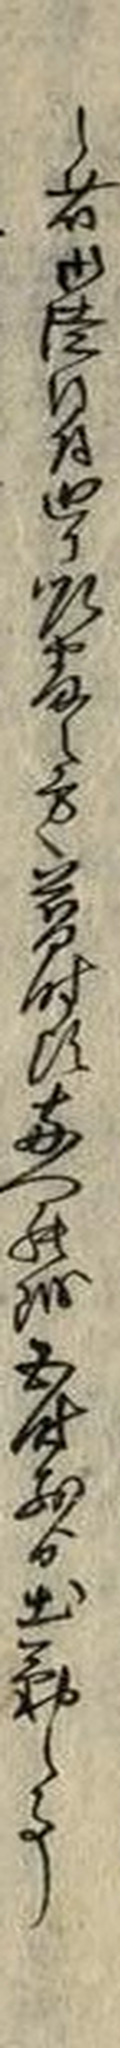之者御徒目付廻り順番之方へ暮時頃両人罷越五時前ゟ出勤之事
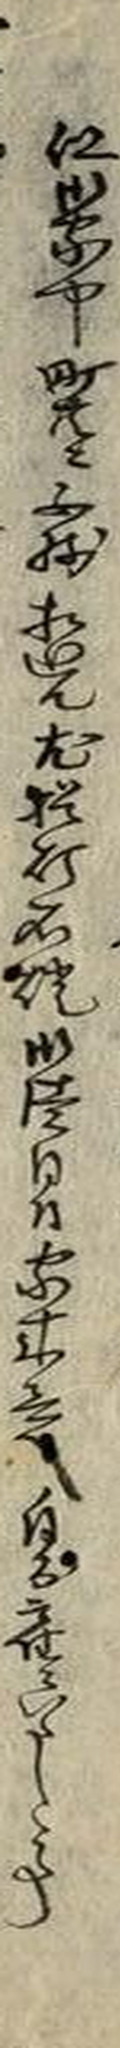但御家中町共に不残相廻ル尤提灯不燈御徒目付家来壱人自分雇にいたし候事
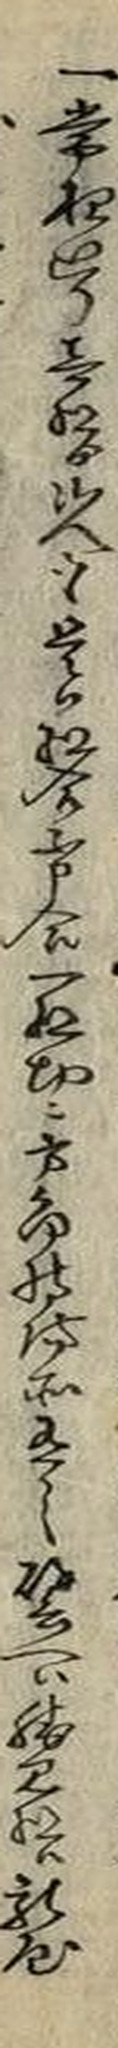一常夜廻り壱組ゟ弐人ツヽ是は組合不申合一組切に方角持場所有之譬へは勝見組は新屋
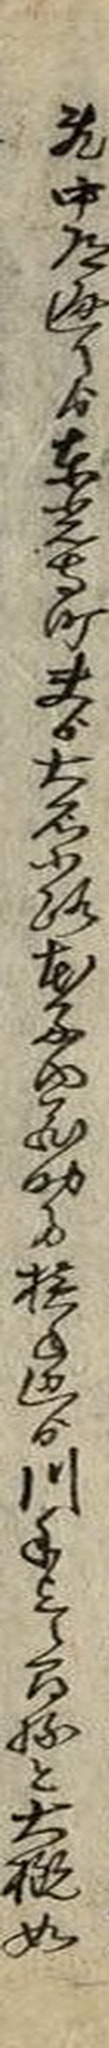敷中道通りゟ東光寺町夫ゟ大名小路本多内蔵助方横手辺ゟ川手迄之間抔と大概如
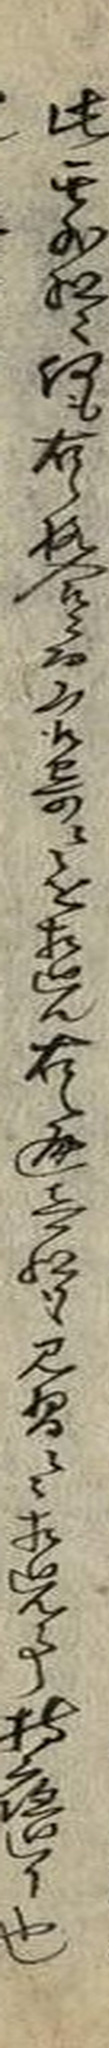此其外組々何も右之振合にて最寄々々を相廻ル右之通壱組ツヽ見習々々相廻ル事持夜廻り也
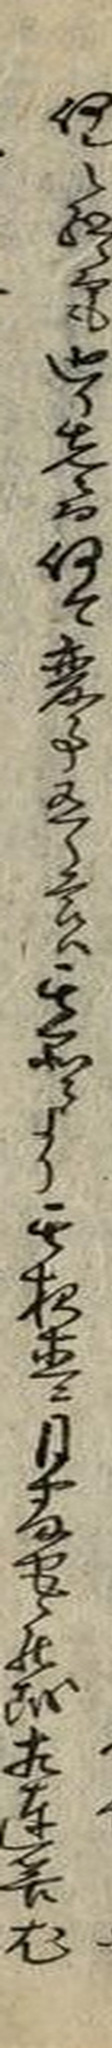何レ之組にても廻り先にて何そ変事有之節は其品により其夜直に月番宅へ罷越相達筈尤
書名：御城下諸事之部
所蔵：福井県文書館 Fukui Prefectural Archives
